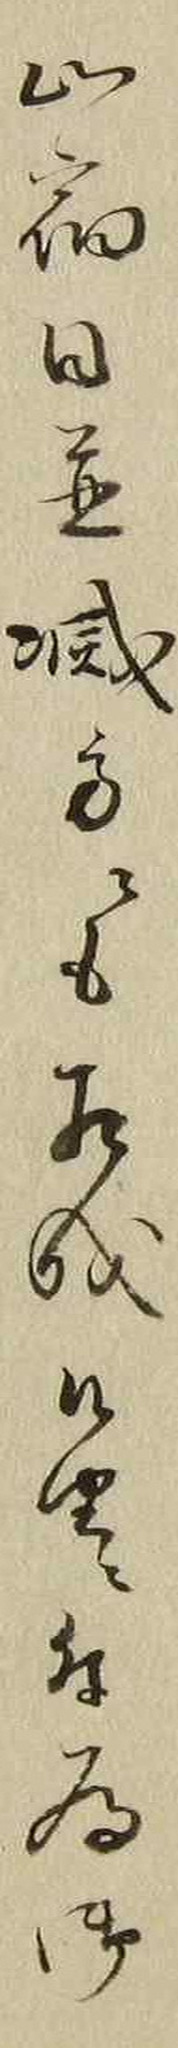止宿日並減方ニも相成候由ニ付為御
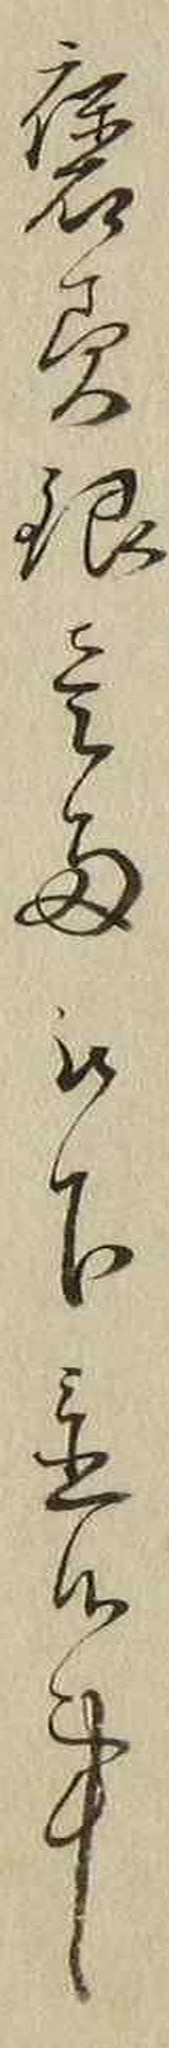褒美銀壱両被下置候事
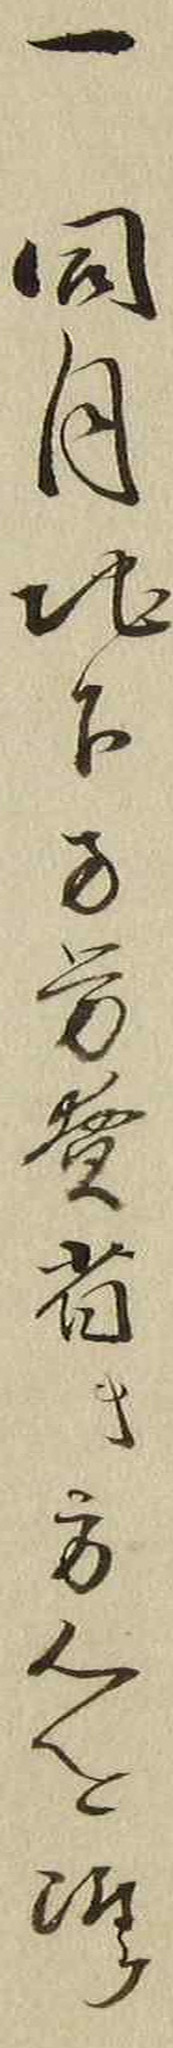一同月地下方労費省き方心を附ケ
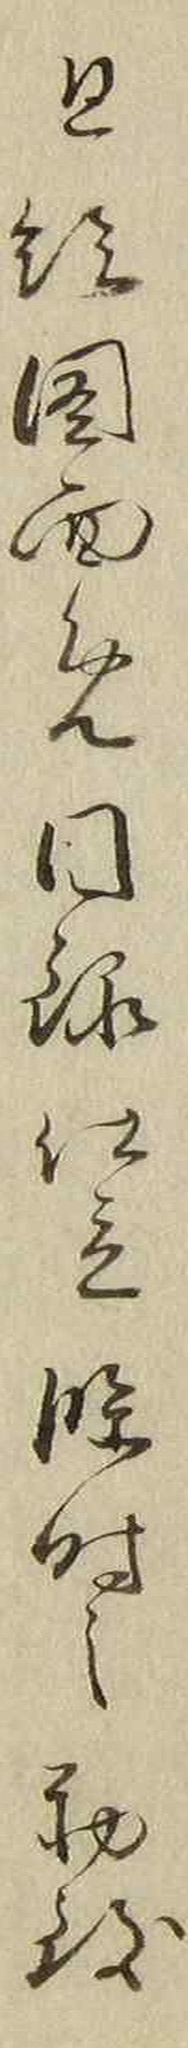且絵図面免目録仕立臨時之勤致
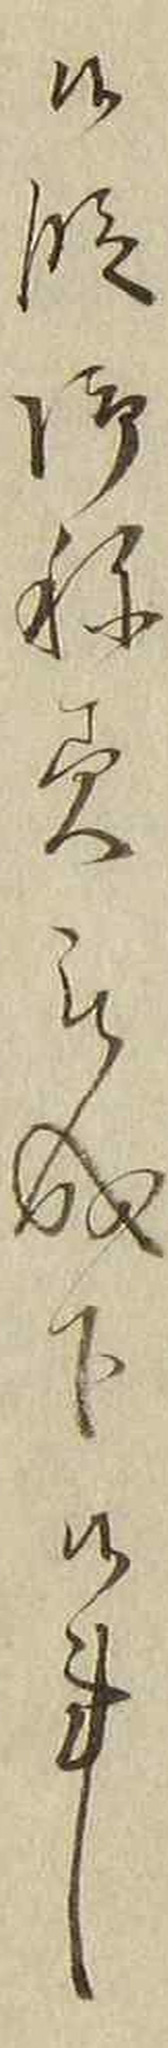候段御称美被成下候事
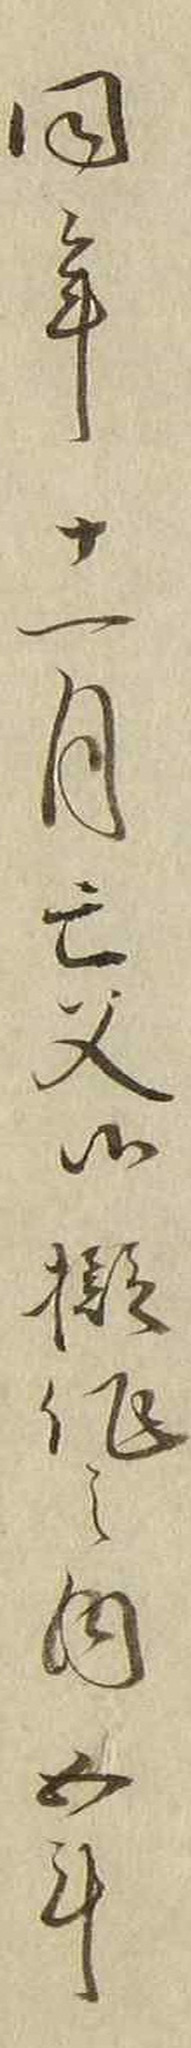一同年十一月亡父御擬作之内五斗

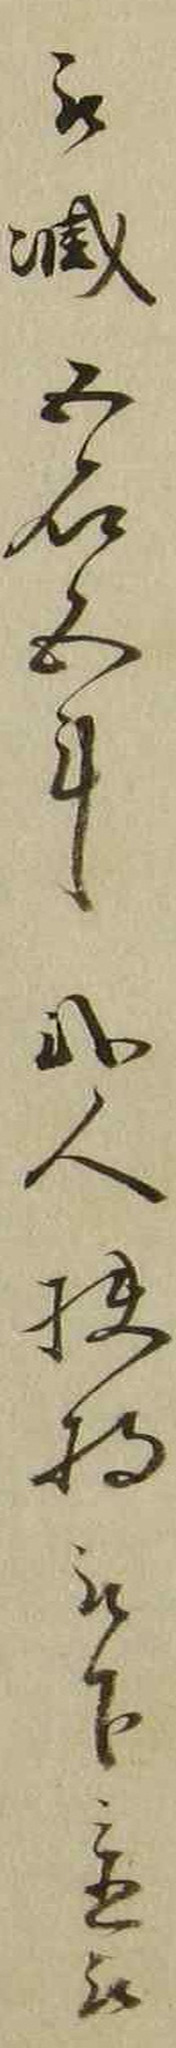被減五石五斗弐人扶持被下置候
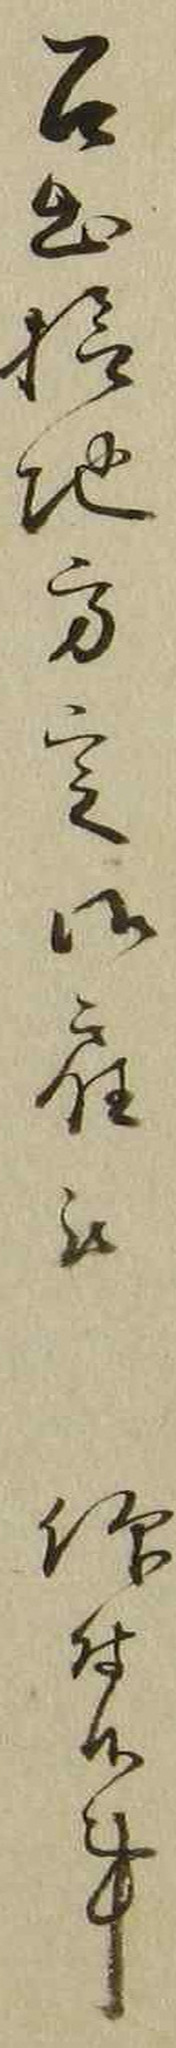召出検地方定御雇被仰付候事
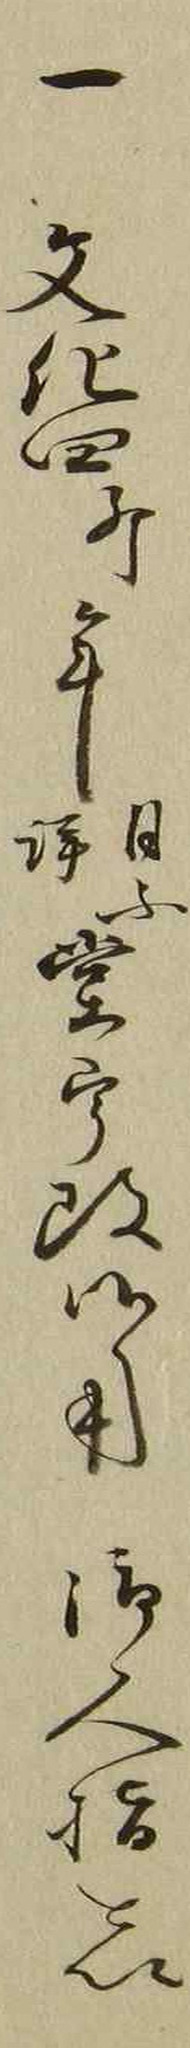一文化四卯年月不詳堂宇改御用御人指を以
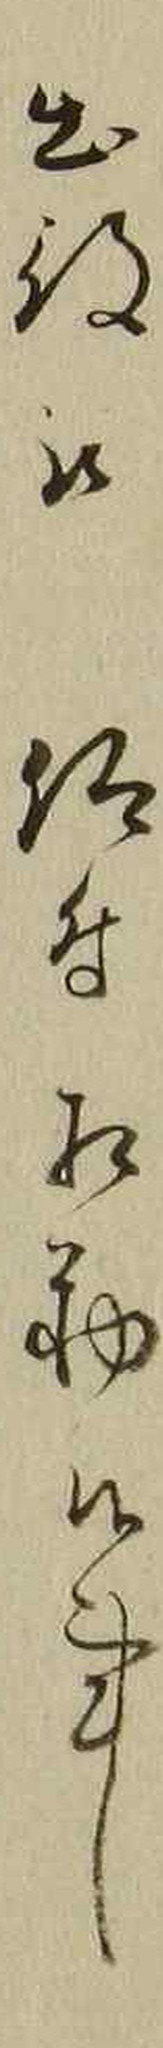出役被仰付相勤候事
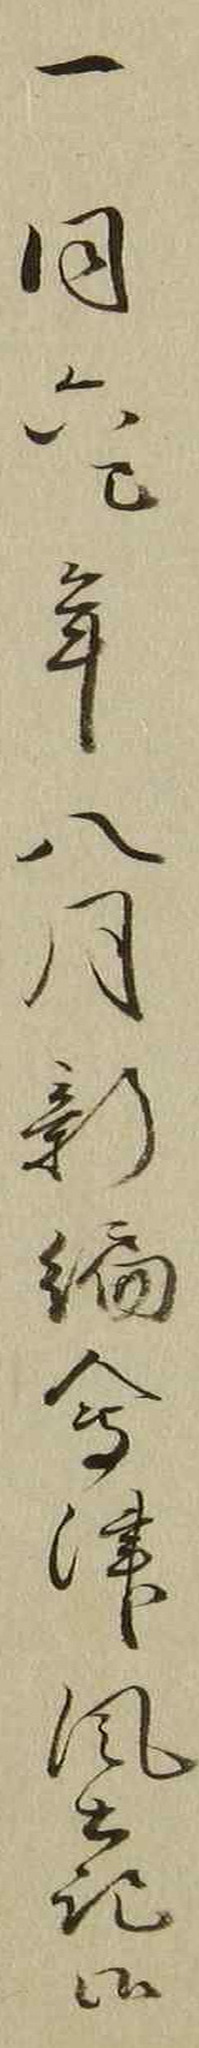一同六巳年八月新編会津風土記御
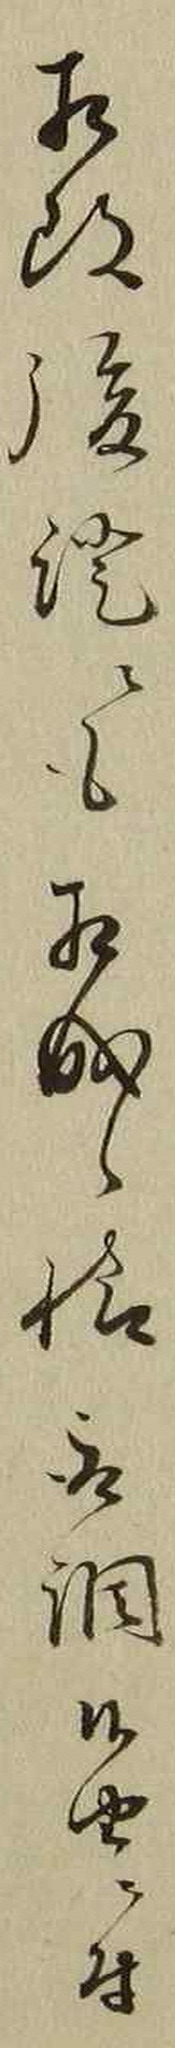相改後証ニも相成候様取調候由ニ付
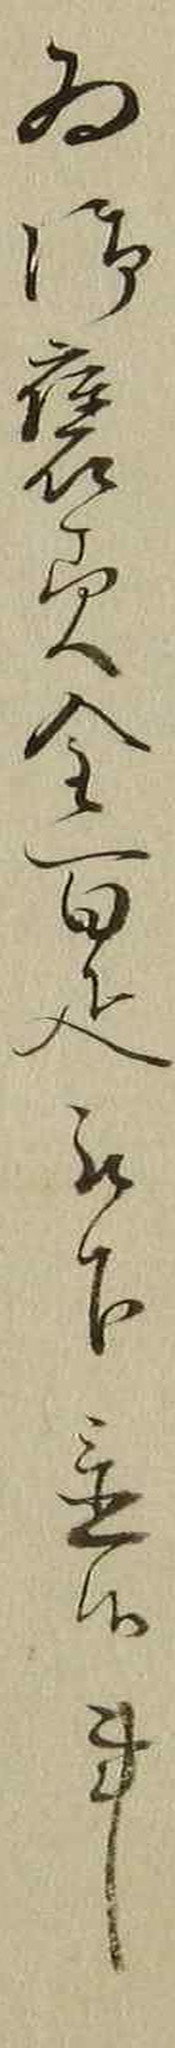為御褒美金百疋被下置候事
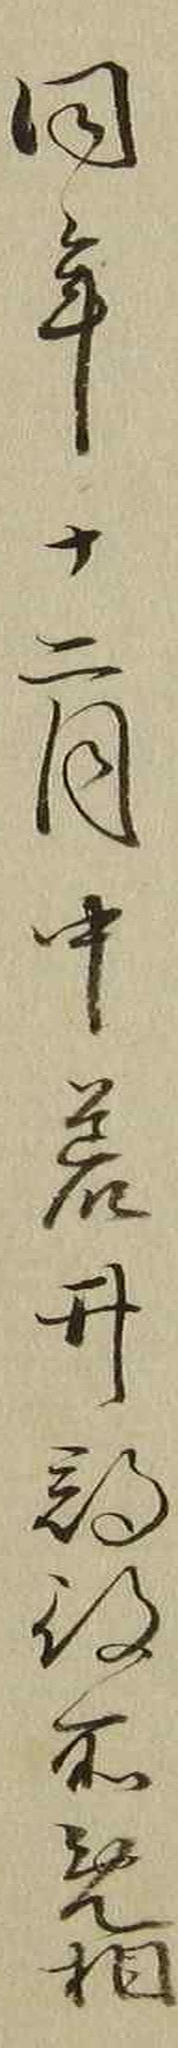一同年十二月中荒井郡役所免相
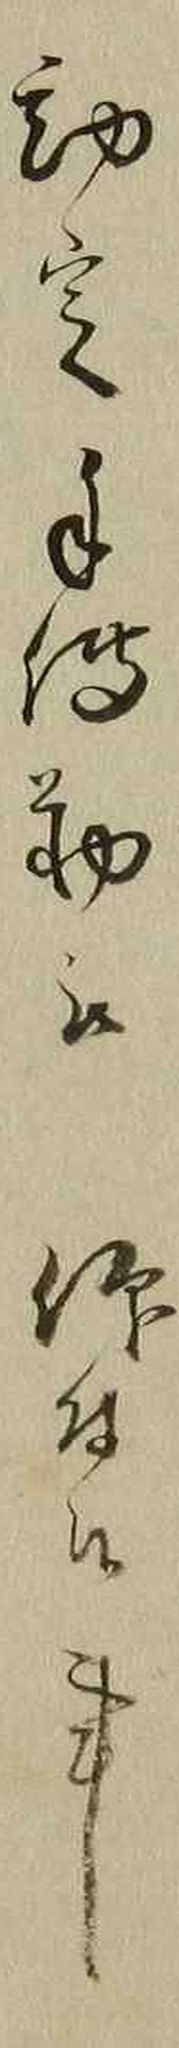勘定手伝勤被仰付候事
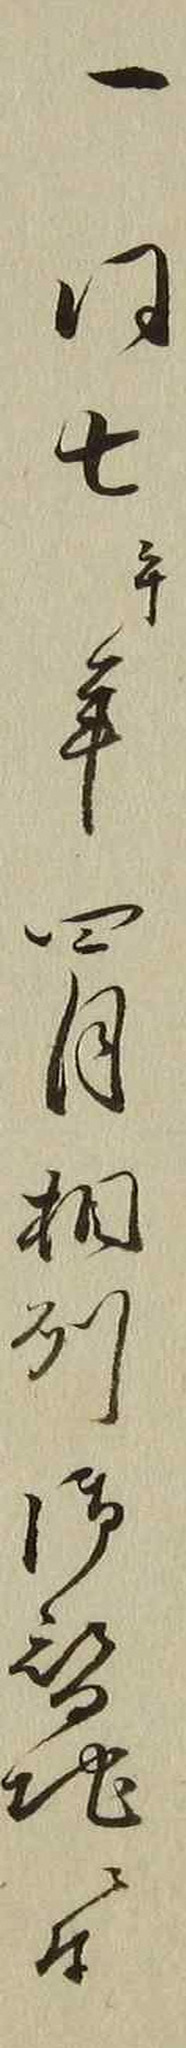一同七午年四月相州御替地ニ付
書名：諸士系譜　巻之32　い之部32
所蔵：会津若松市立会津図書館
